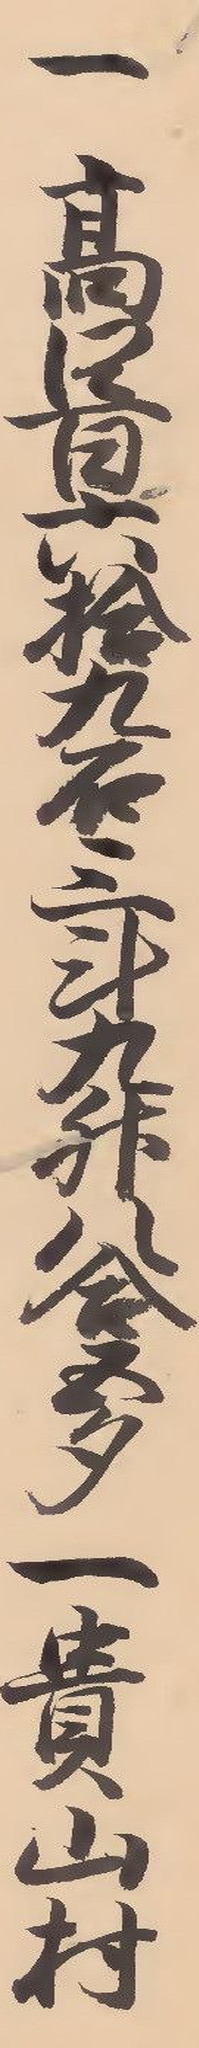一高四百六拾九石三斗九升八合五勺一貴山村
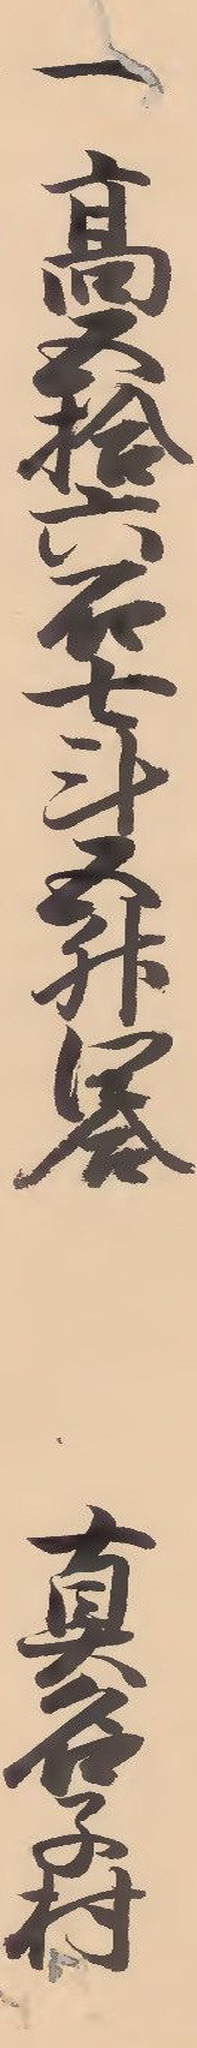一高五拾六石七斗五升四合真名子村
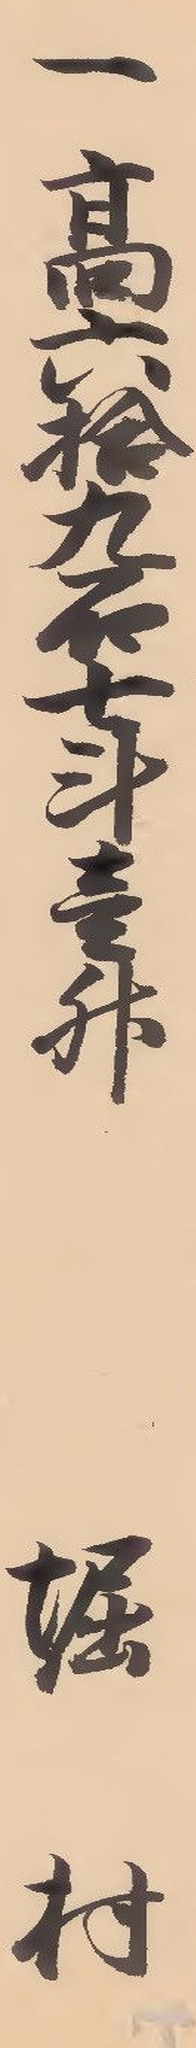一高六拾九石七斗壱升堀村
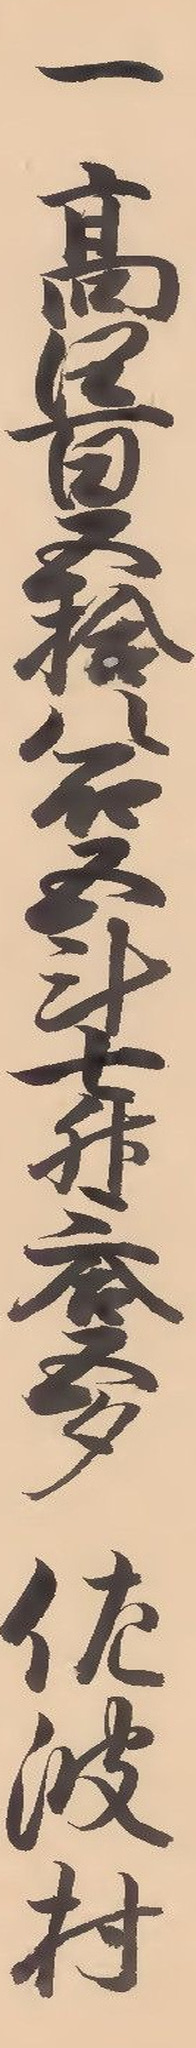一高四百五拾八石五斗七升三合五勺佐波村
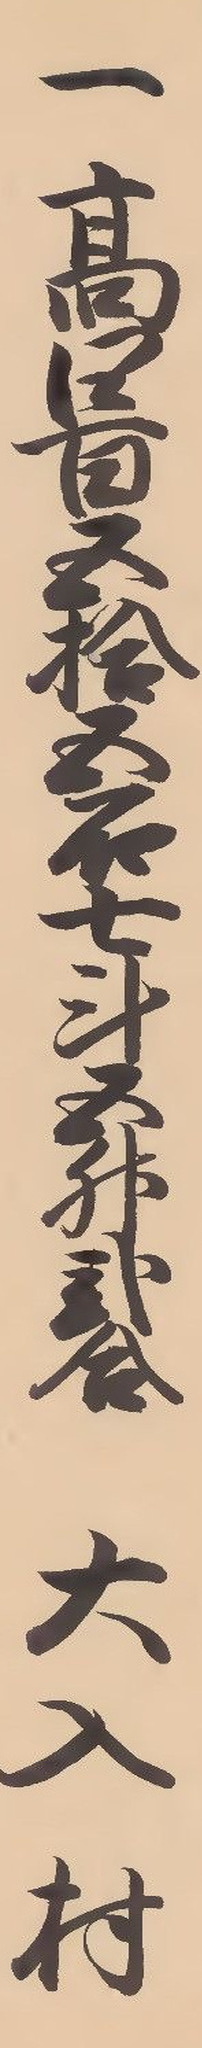一高四百五拾五石七斗五升弐合大入村
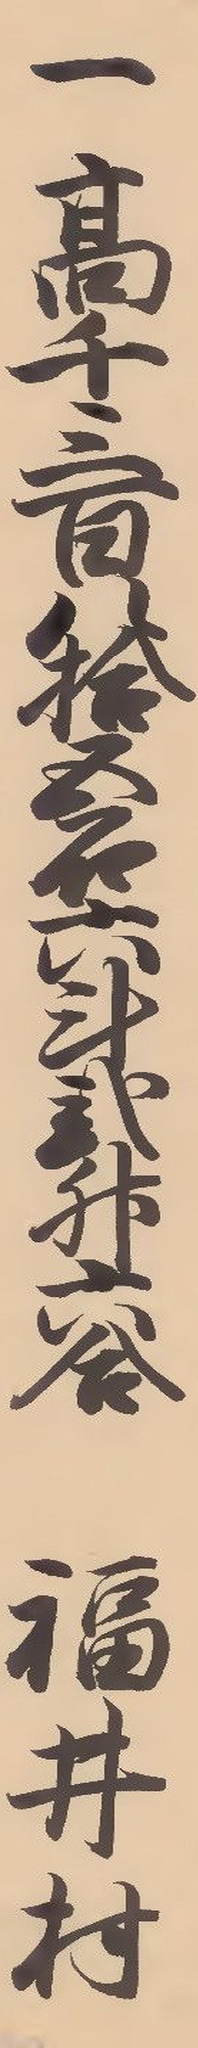一高千三百八拾五石六斗弐升六合福井村
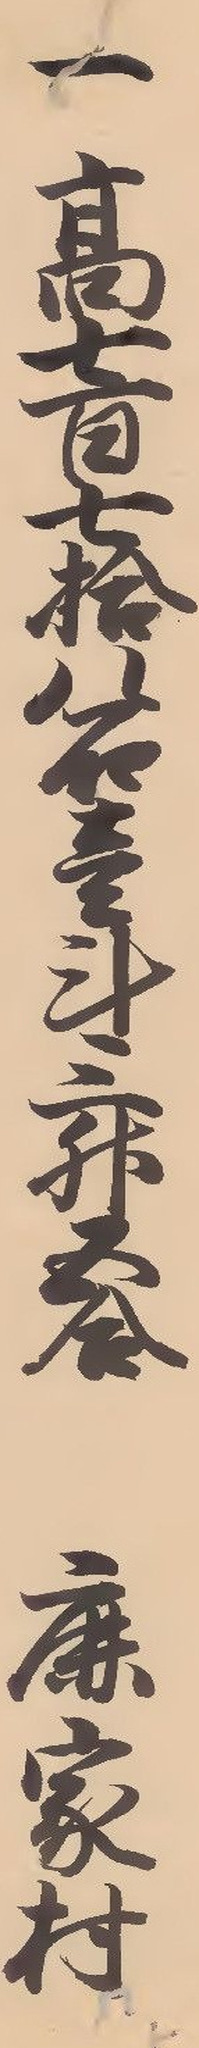一高七百七拾八石壱斗三升五合鹿家村
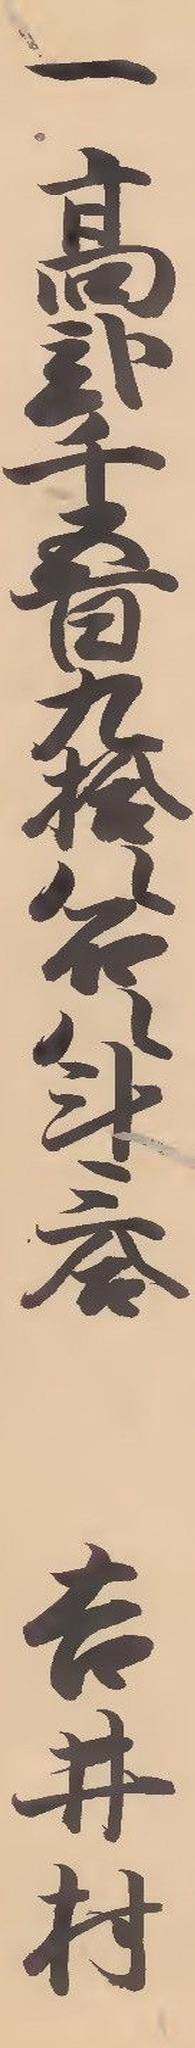一高弐千五百九拾八石八斗三合吉井村

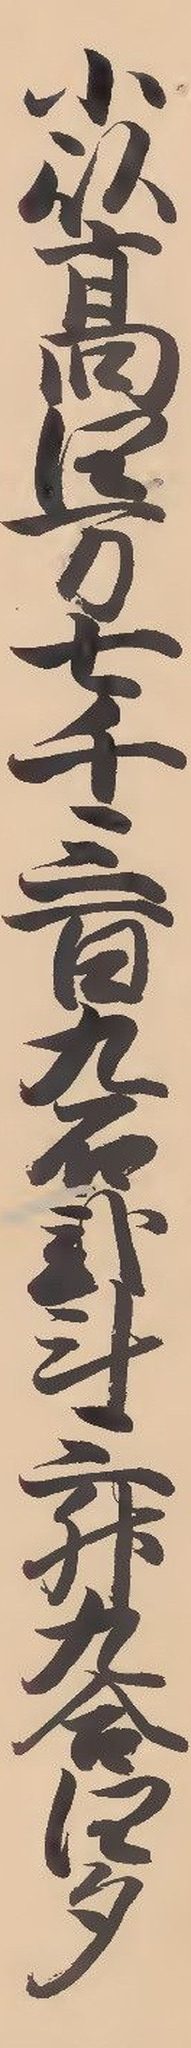小以高四万七千三百九石弐斗三升九合四勺
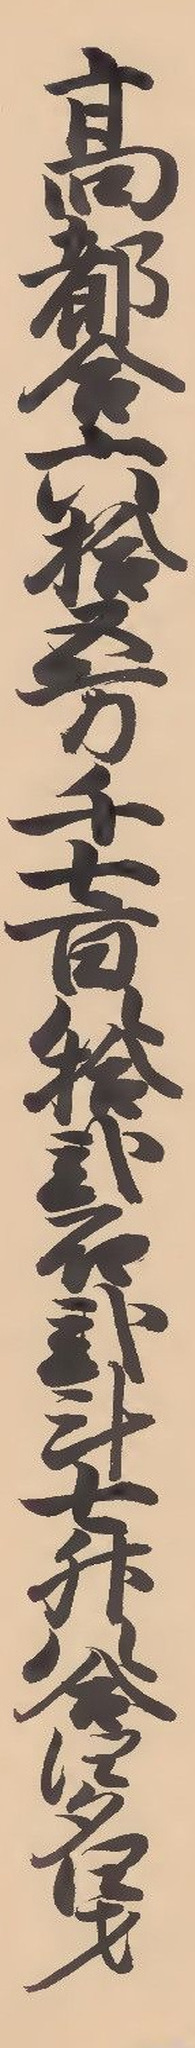高都合六拾五万千七百八拾弐石弐斗七升八合四勺四才
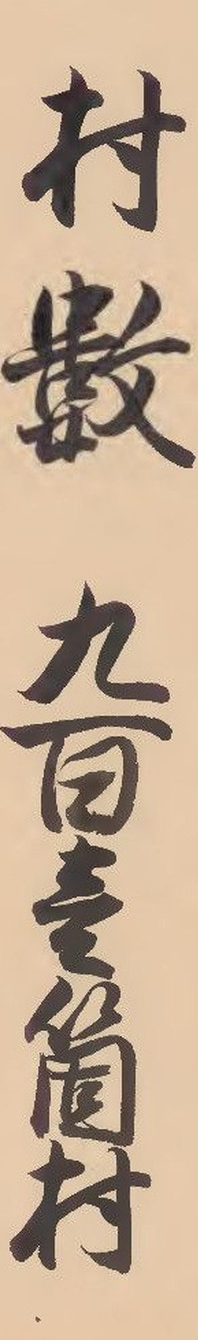村数九百壱箇村
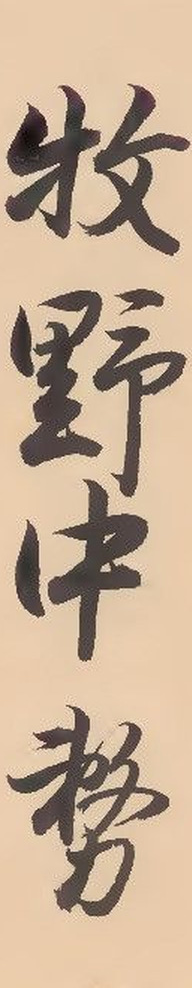牧野中務
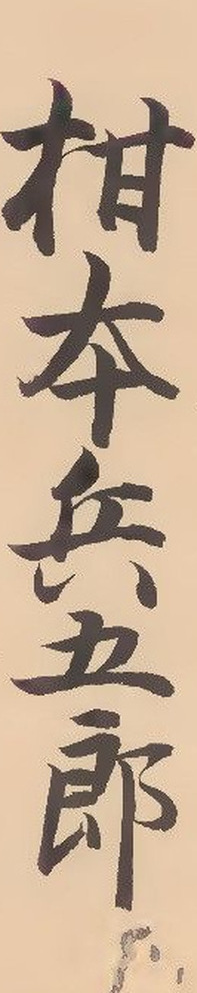柑本兵五郎
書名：筑前国郷帳
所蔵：国立公文書館 National Archives of Japan
